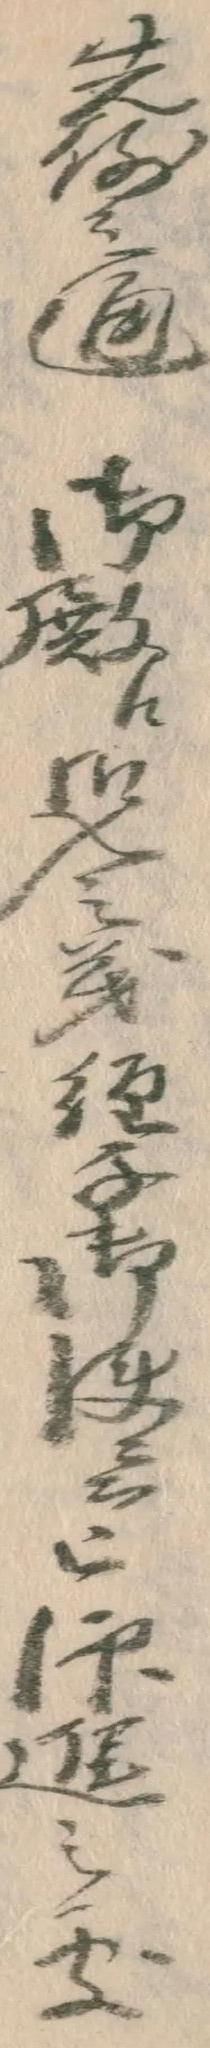先例之通御殿え御入之義経千御使に而被仰進之處
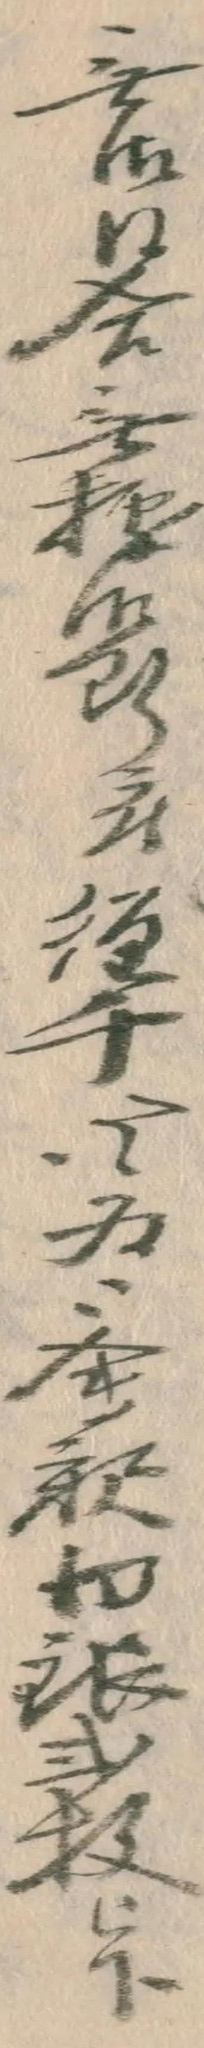無御日合無拠御断ニ付経千へ以為御會釈白銀弐枚被下
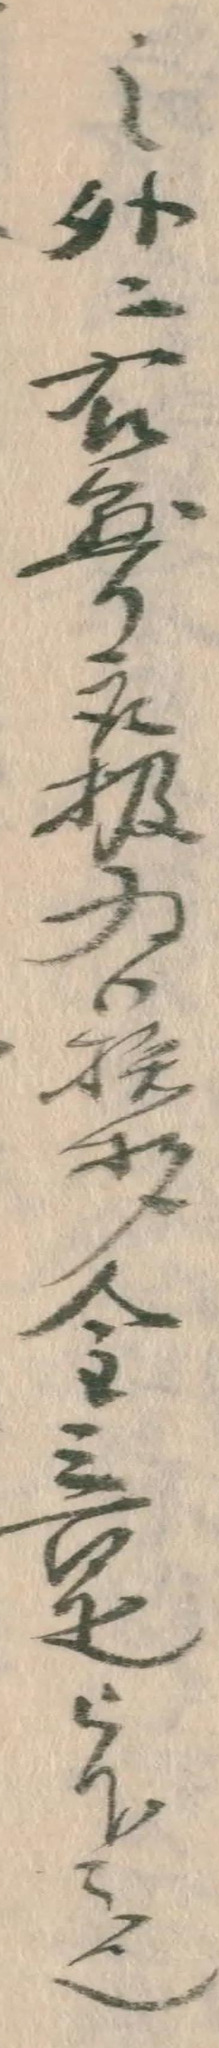之外二右懸り取扱為御挨拶金三百疋被下之也
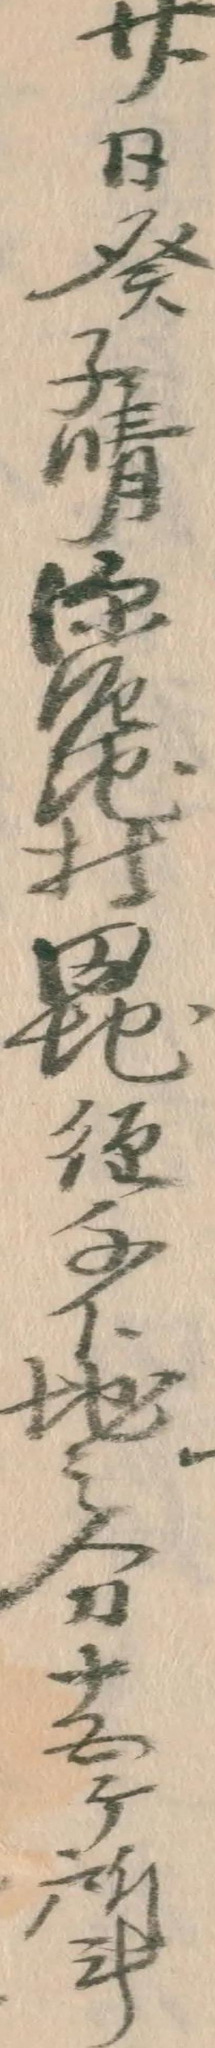廿日癸子晴深泥池村田地経千下地之分十五ケ所斗
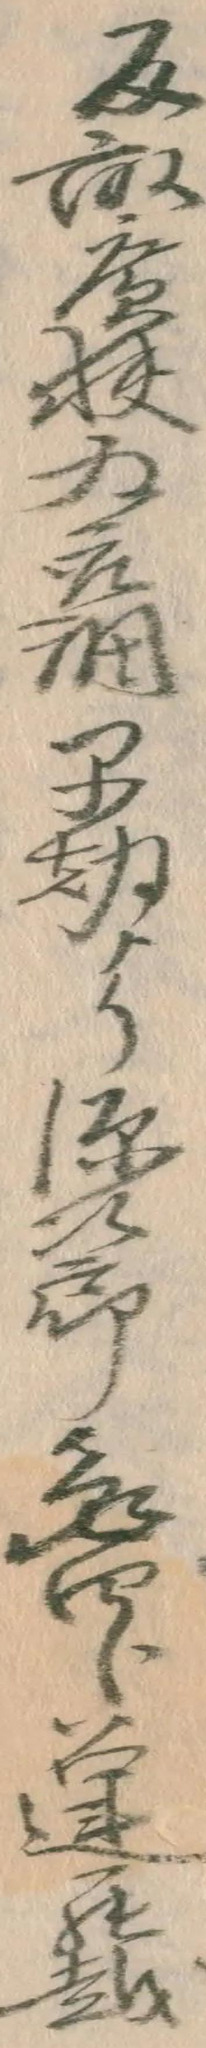反畝廣狭為取調早朝より源次郎亀四郎召連罷越
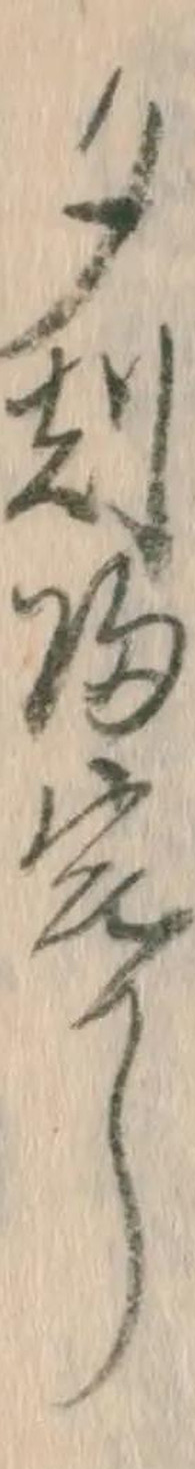夕刻帰宅了
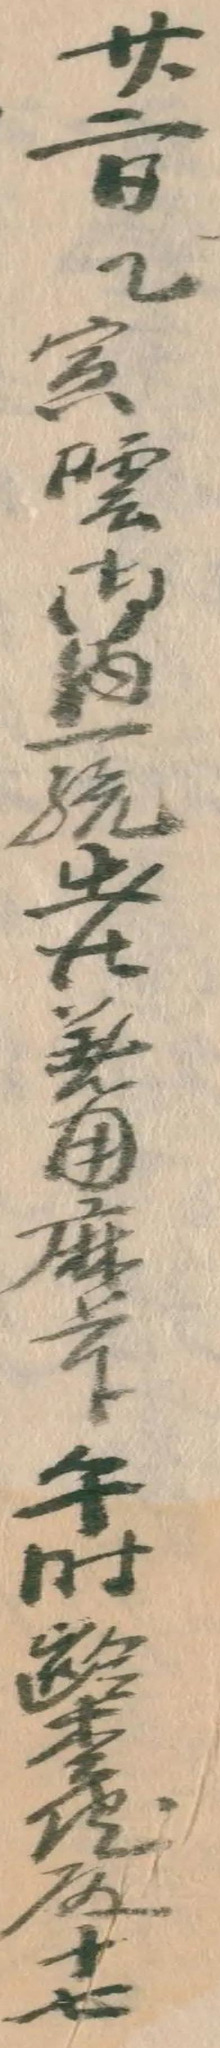廿二日乙寅曇御内一統出仕着用麻上下午時齢杢院殿十七
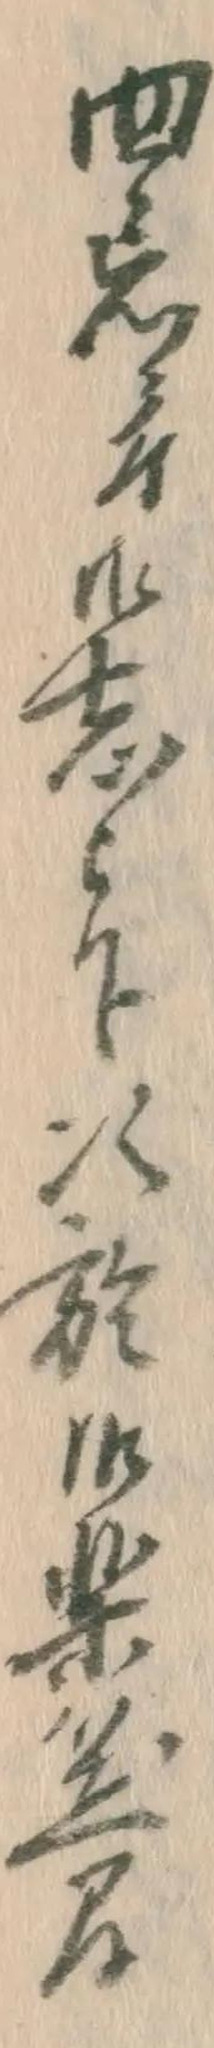回忌ニ付御志被下次於御楽器間
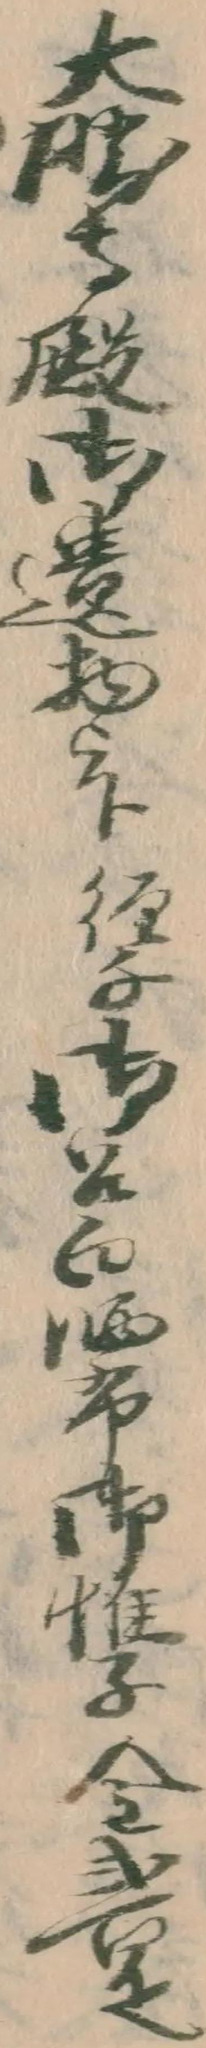大勝寺殿御遺物被下経千御召白晒布御帷子金弐百疋
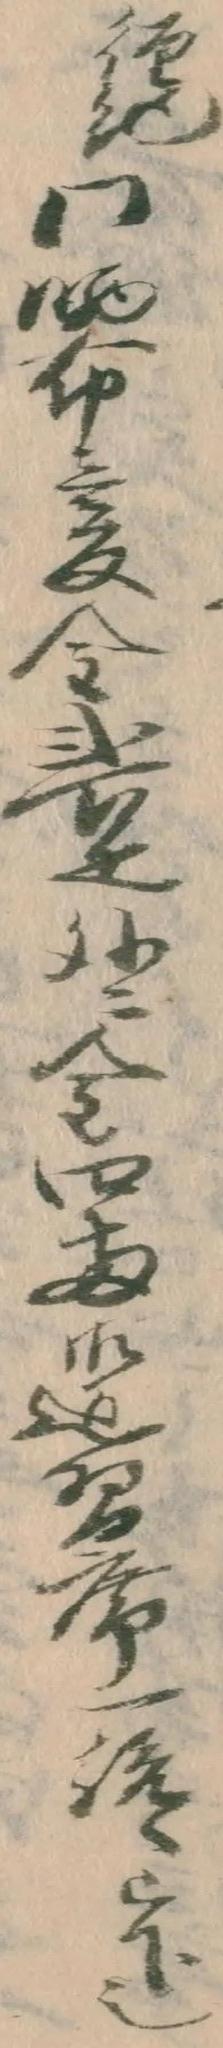経紀同晒布壱反金弐百疋外ニ金四両御近習席一統へ被下也
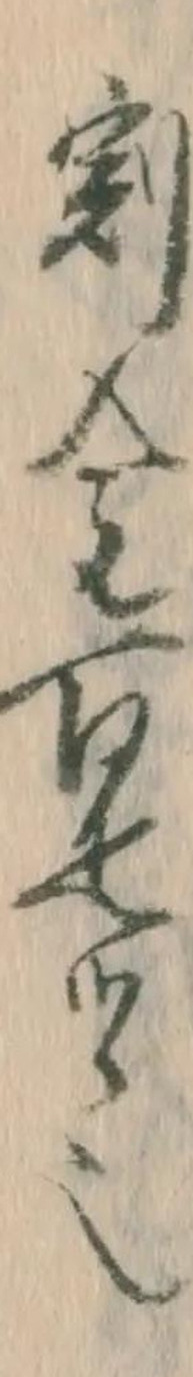割金百疋ツヽ也
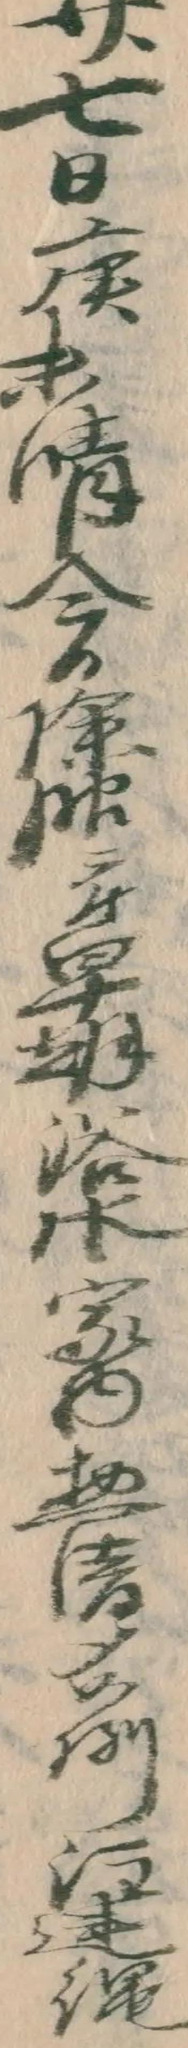廿七日庚未晴今日除服ニ付早朝浴水家内惣清メ如例注進縄
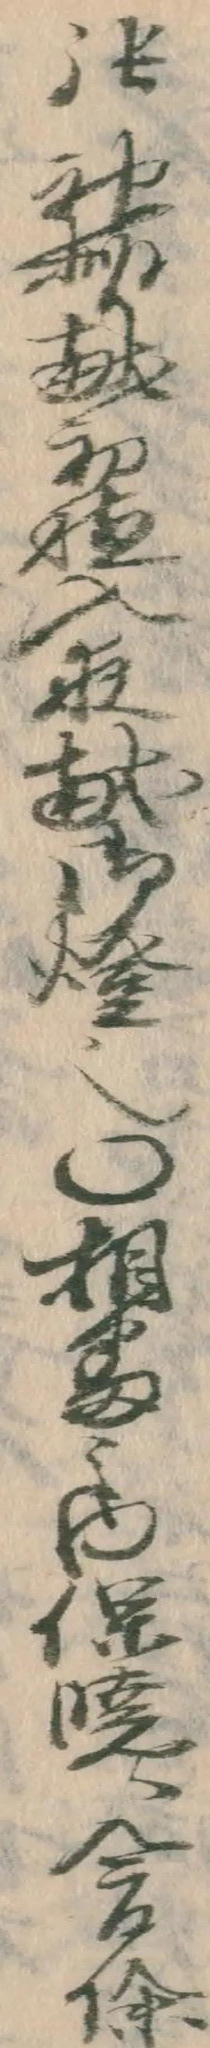張神棚献初穂入夜献御燈也○相番之内保暁へ今日除
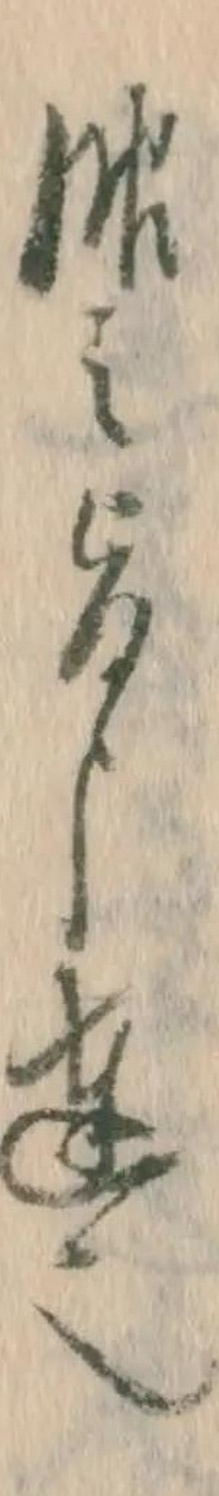服之旨申達也
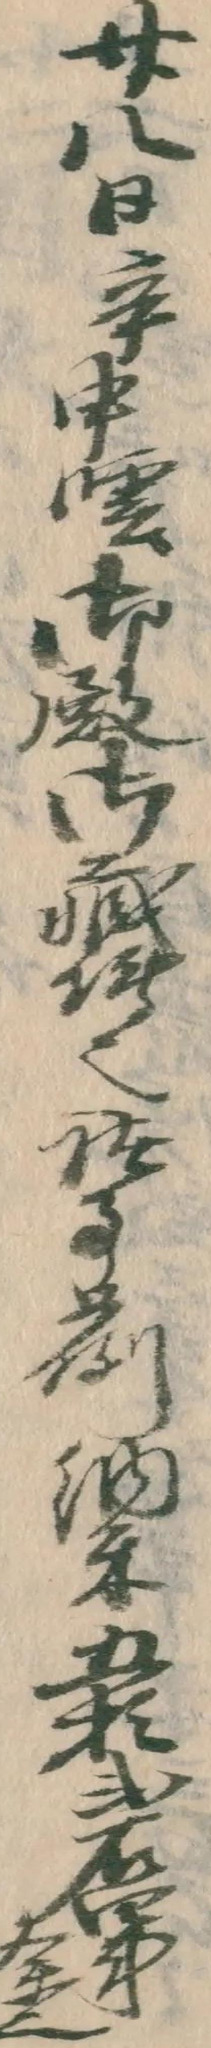廿八日辛申曇御殿御蔵仰也諸事如例納米五拾弐石四斗五升也
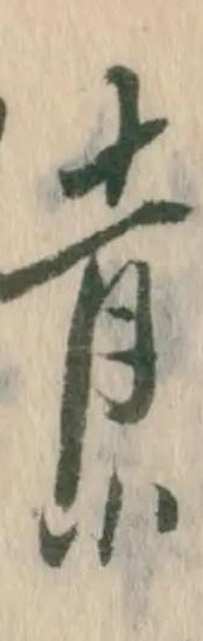十一月小
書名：賀茂社記録. 第67冊
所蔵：国立国会図書館 National Diet Library, JAPAN
